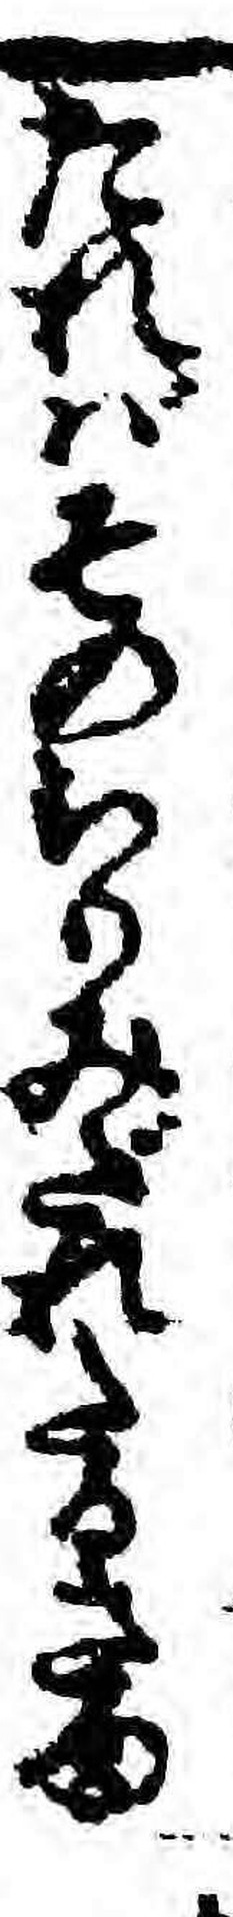たればそのちりみだれたるさま
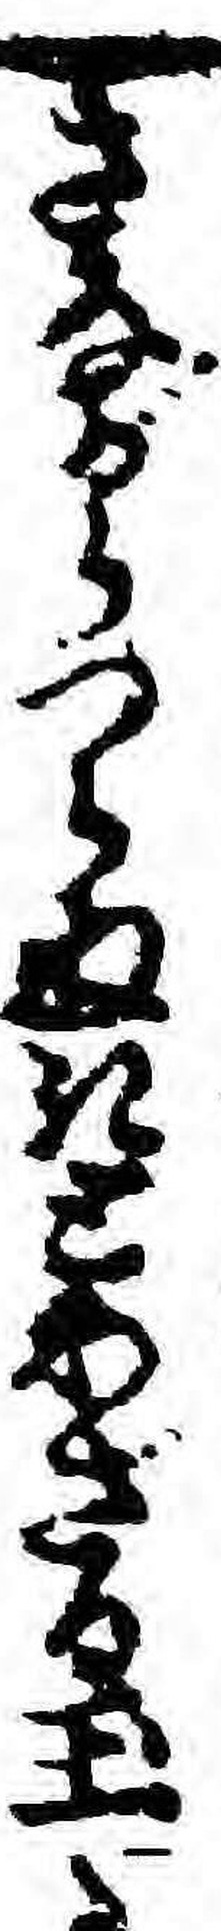さながらつらぬきとめざる玉
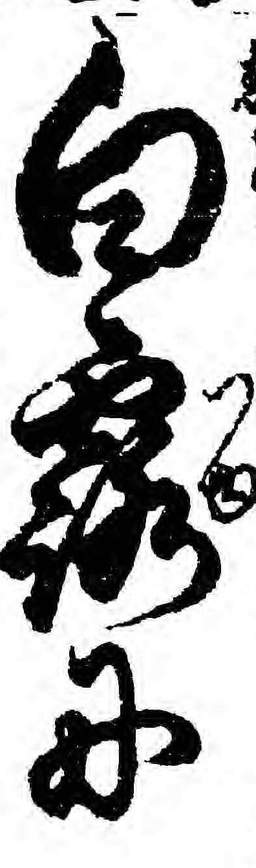白露に
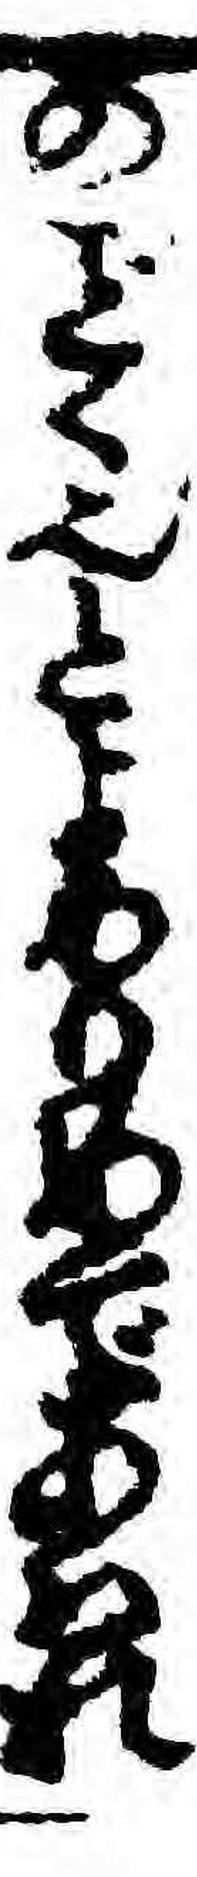のごとく也とよめりめであはれ
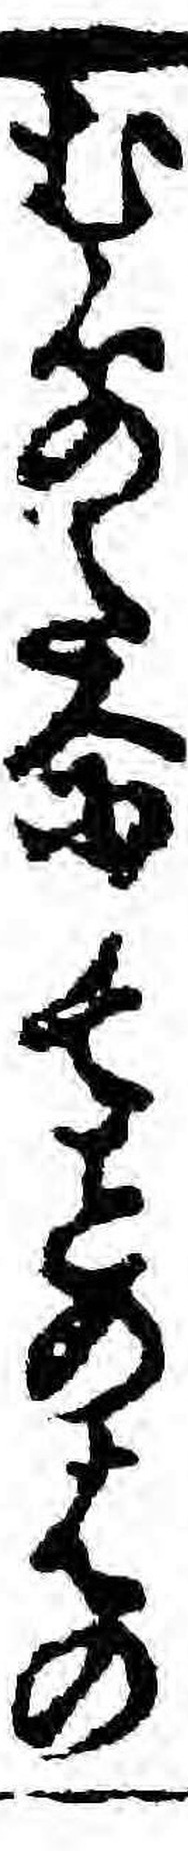む心のたへにしてことのはの
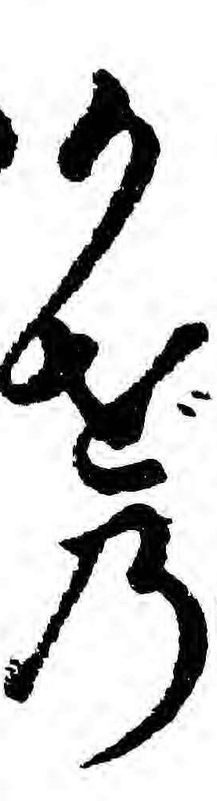かぜの
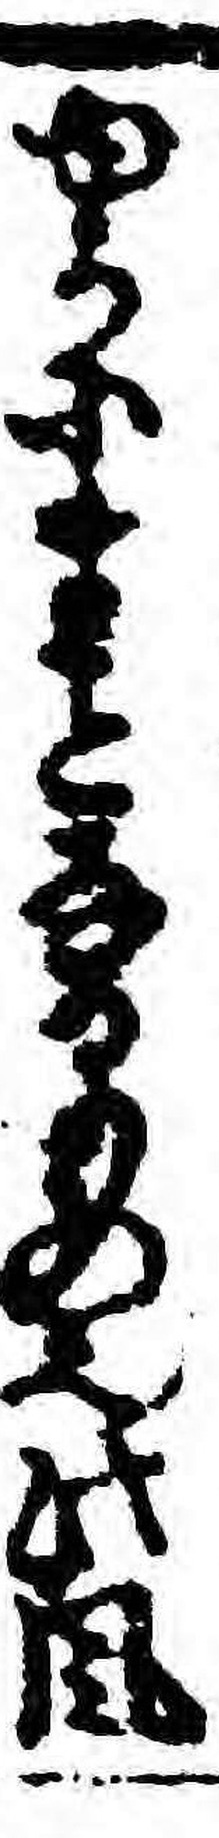ゆうにまことなるもの也此風
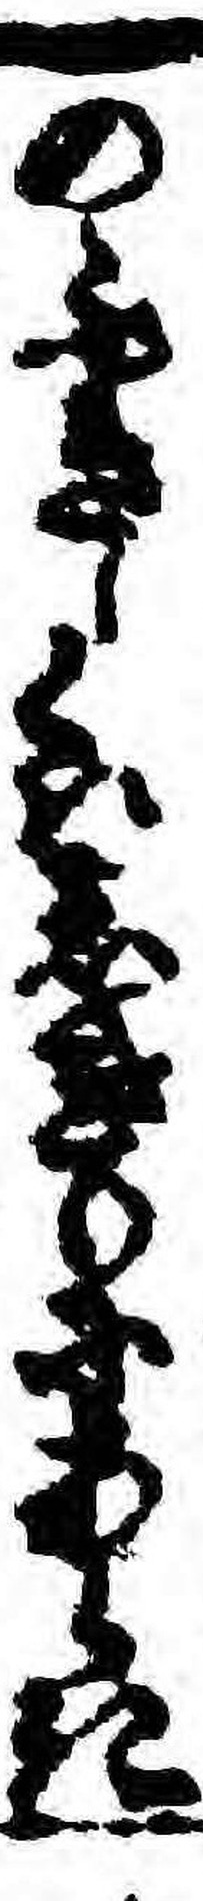のふきしくはしきりにあらき
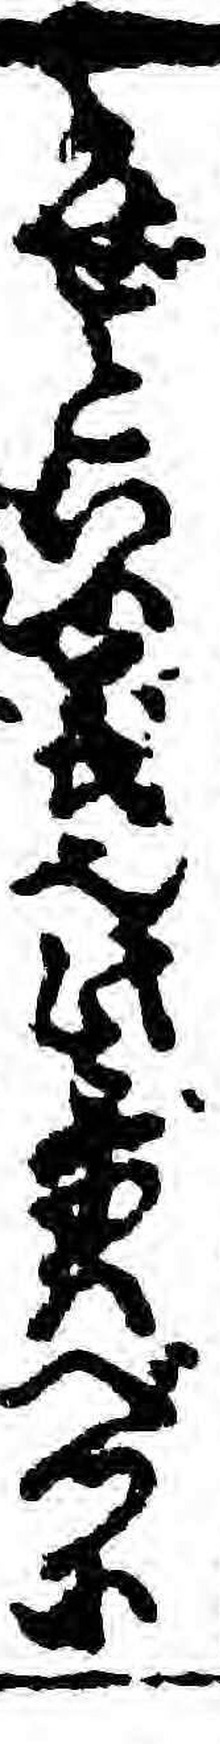かぜといふ義也此哥はべつに
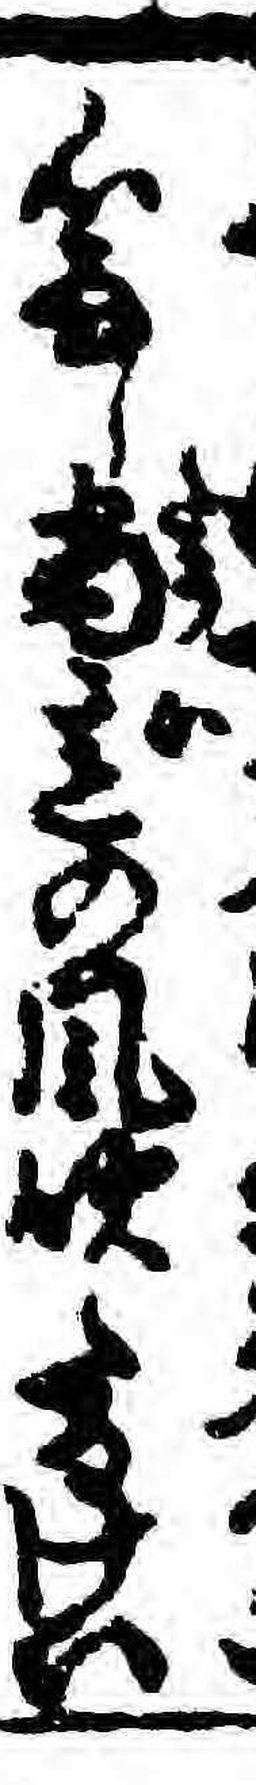心なし当意の風吹たるけい
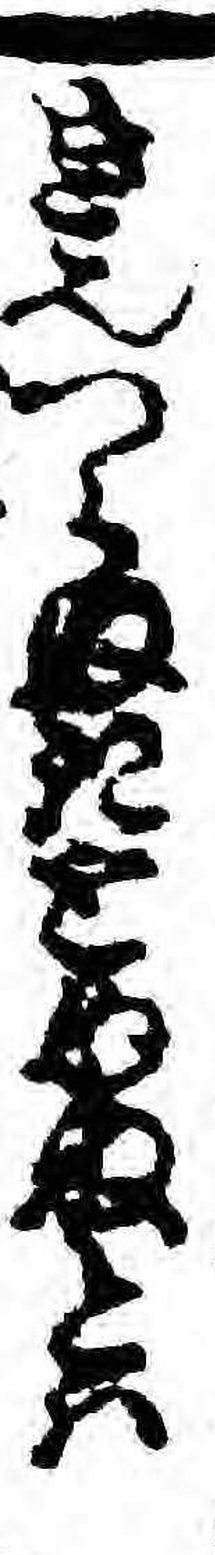き也つらぬきとめぬとは
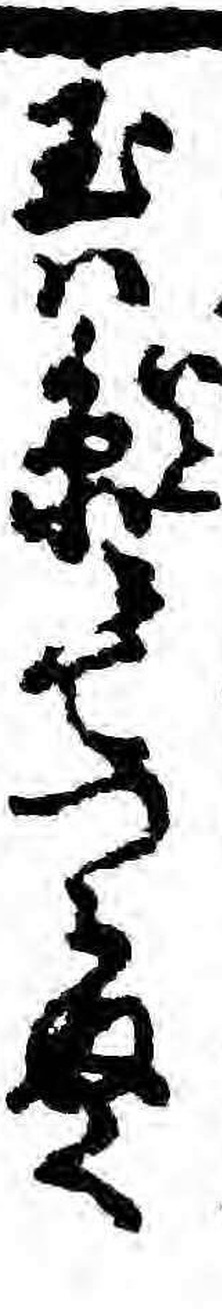玉は糸にてつらぬく
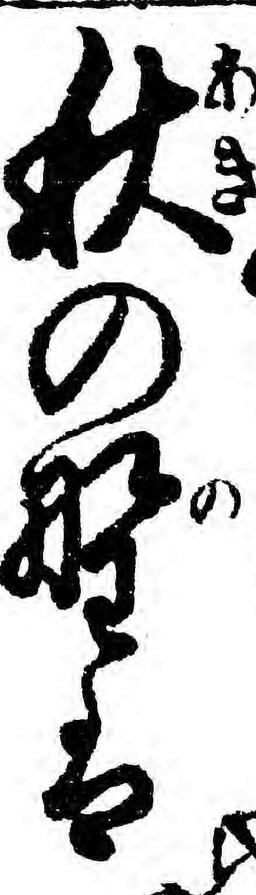秋の野は
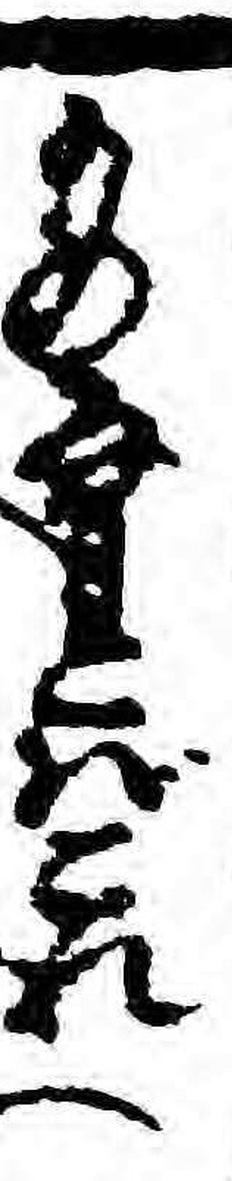ものなればこれ
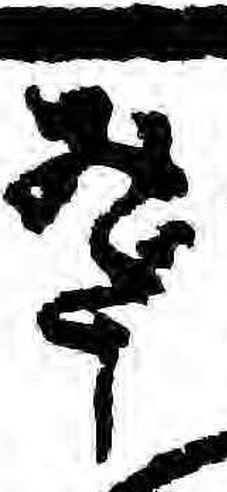みだし
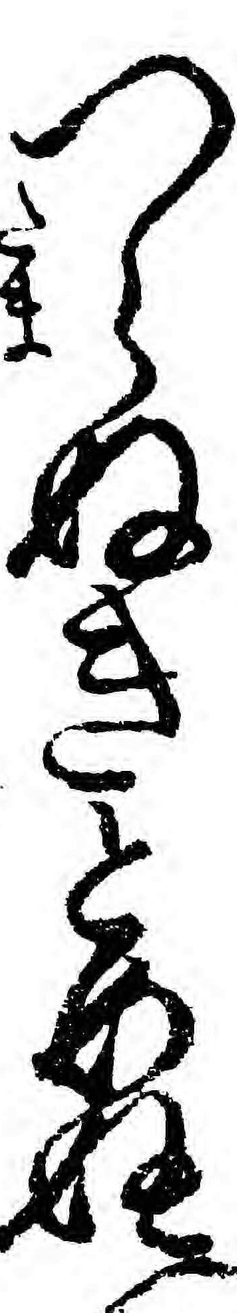つらぬきとめぬ
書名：頭書和歌注譯／壽賀多百人一首小倉錦
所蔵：国文学研究資料館
